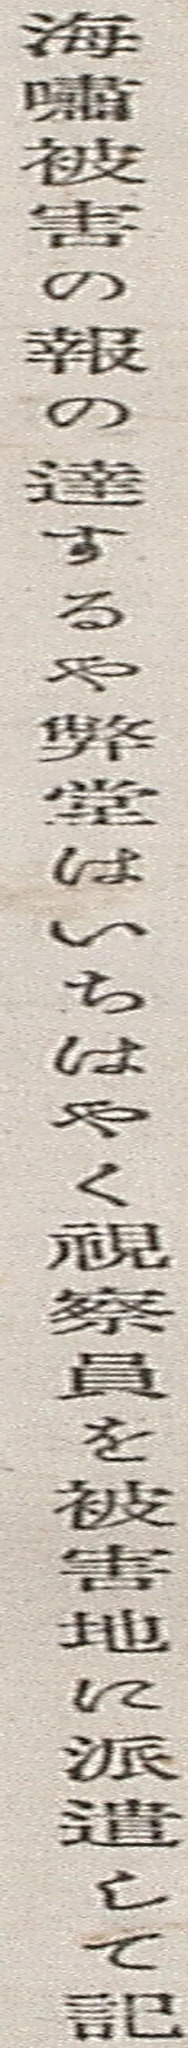海嘯被害の報の達するや弊堂はいちはやく観察員を被害地に派遣して記
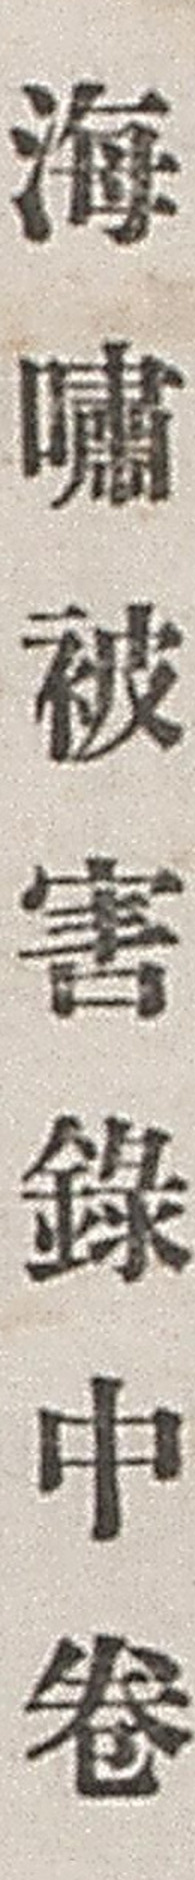海嘯被害録中巻
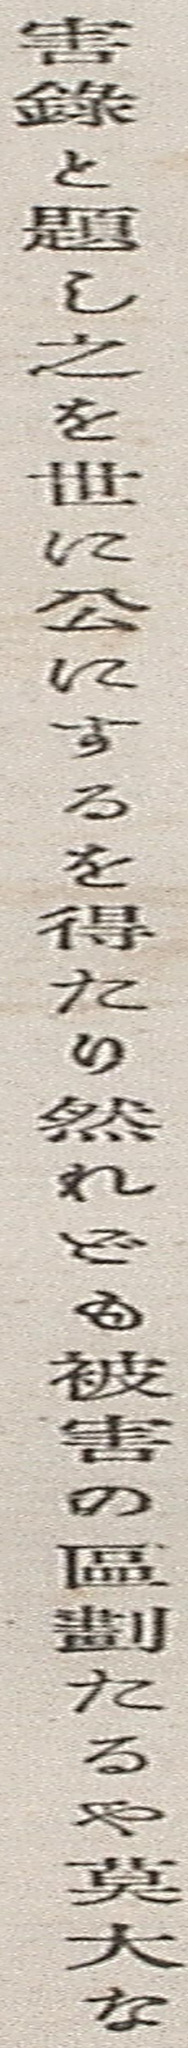害録と題し之を世に公にするを得たり然れども被害の区割たるや莫大な
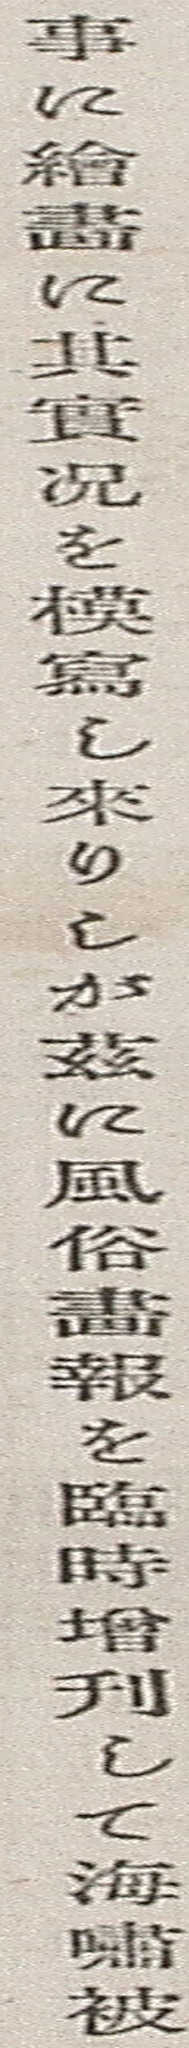事に絵画に其実況を模写し来たりしが茲に風俗画報を臨時増刊して海嘯被
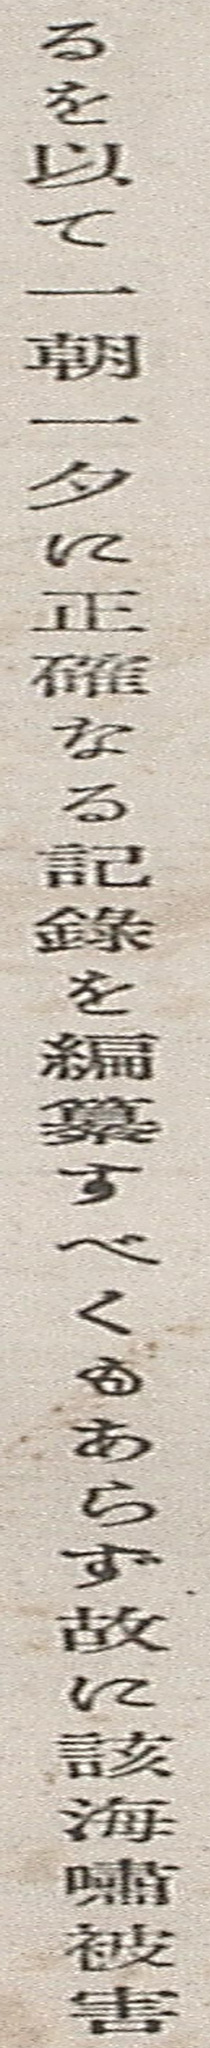るを以て一朝一夕に正確なる記録を編纂すべくもあらず故に該海嘯被害
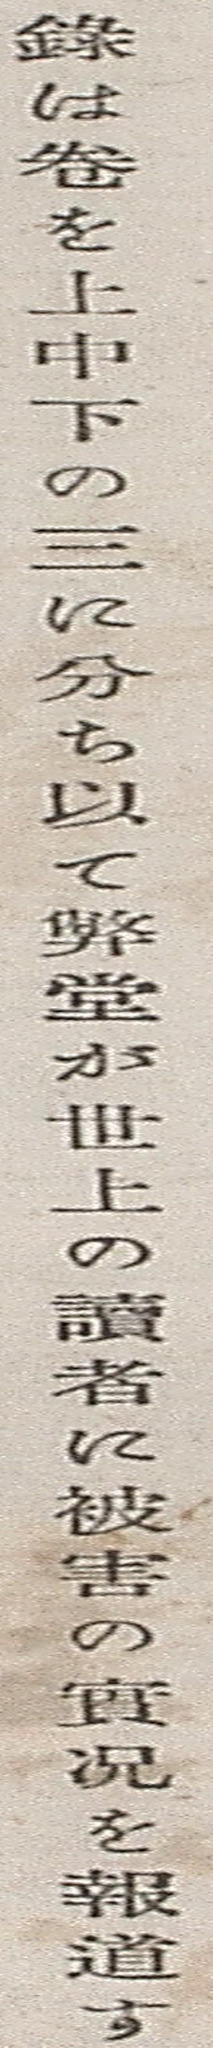録は巻を上中下の三に分ち以て弊堂が世上の読者に被害の実況を報道す
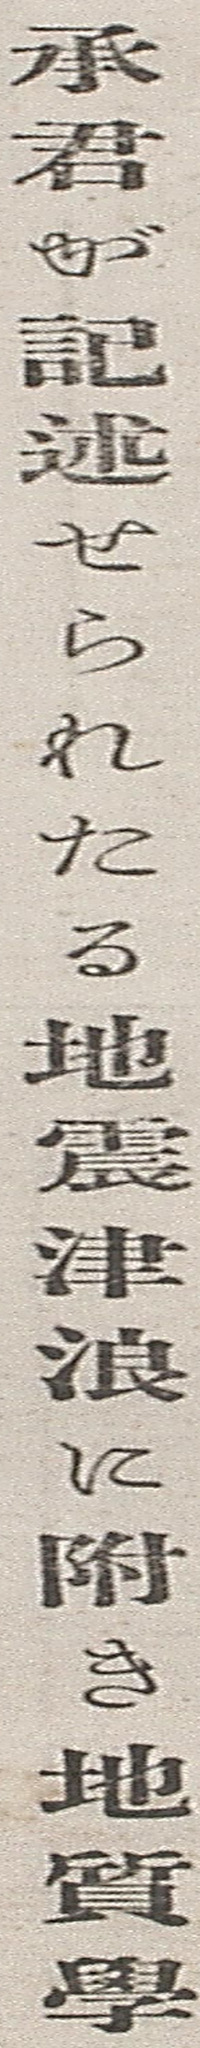承君が記述せられたる地震津浪に付き地質学
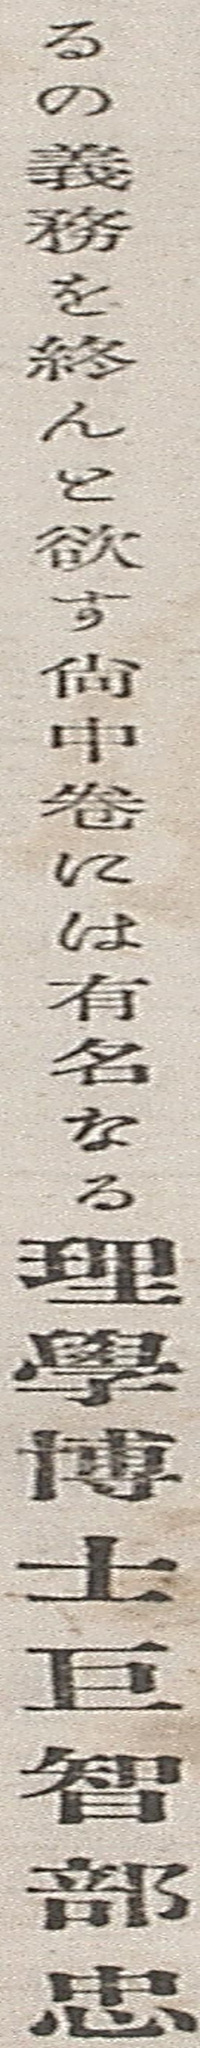るの義務を終んと欲す尚中巻には有名なる理学博士巨智部忠
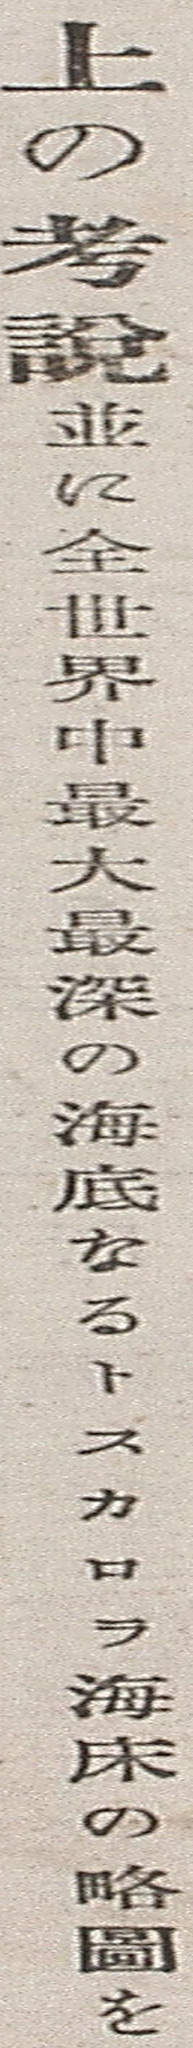上の考説並に全世界中最深の海底なるトスカロラ海床の略図を
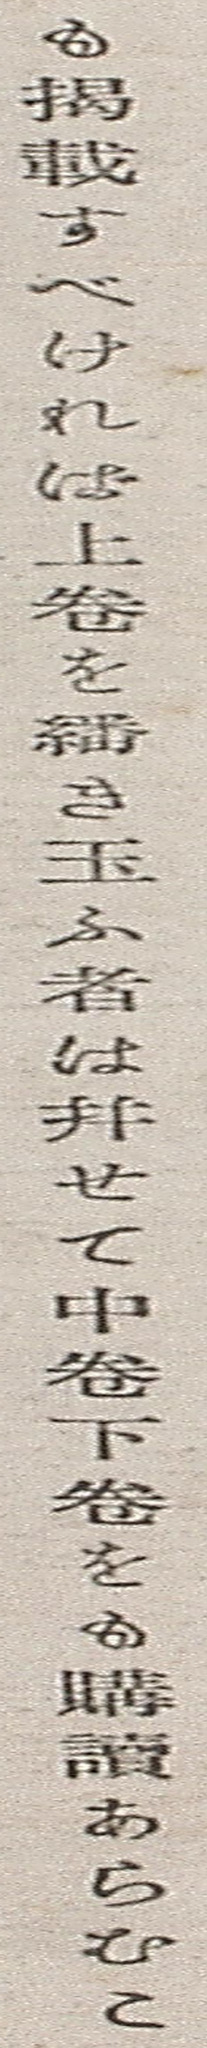も掲載すべければ上巻を繙き玉ふ者は并せて中巻下巻をも購買あらむこ

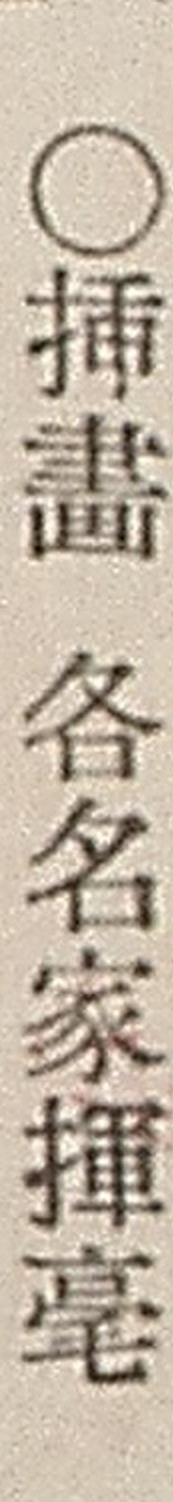〇挿画各名家揮毫
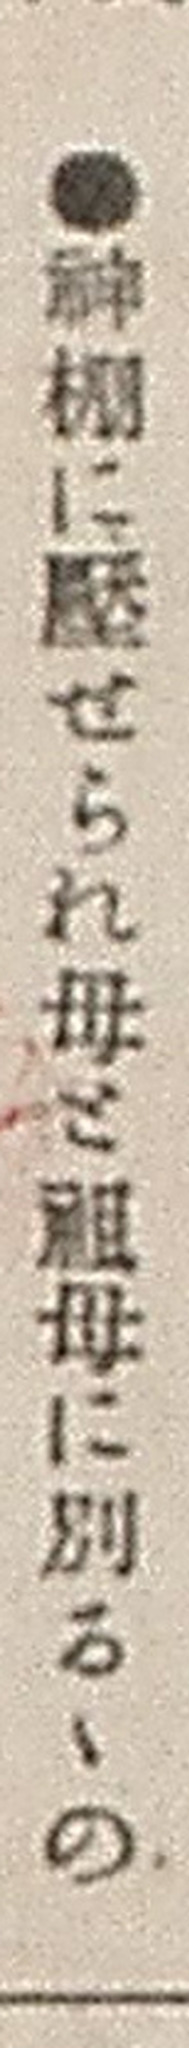●神棚に圧せられ母と祖母に別るゝの
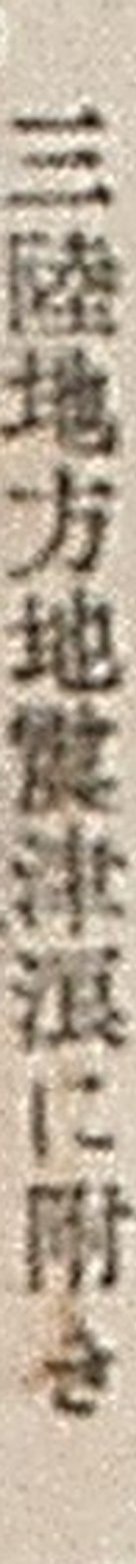三陸地方地震津浪に附き
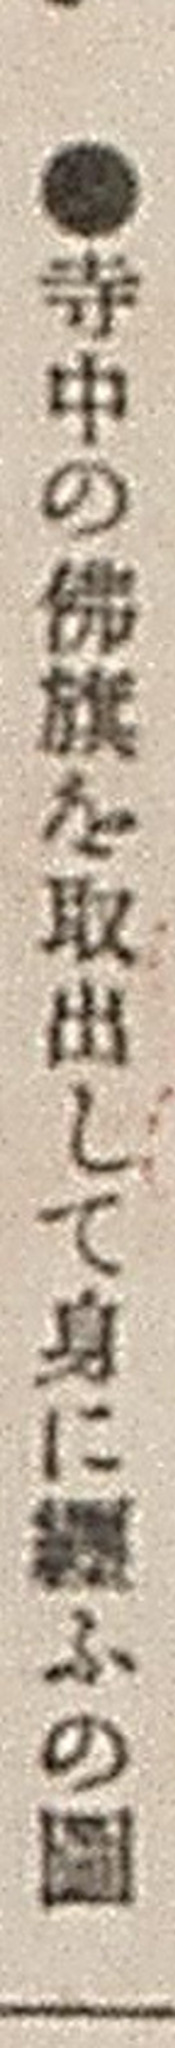●寺中の仏旗を取出して身に纒ふの図
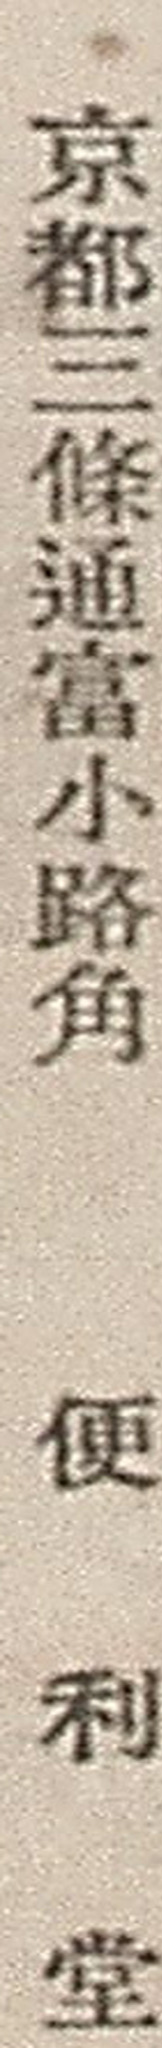京都三条通富小路角便利堂
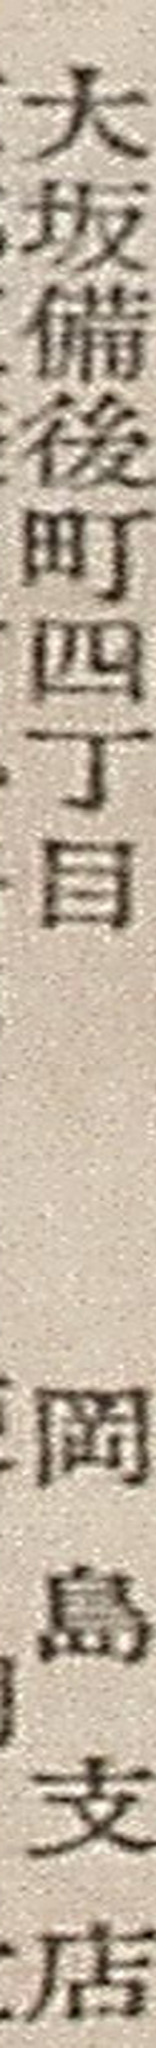大坂備後町四丁目岡島支店
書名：風俗畫報臨時増刊第百二十號　大海嘯被害録（下）
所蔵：東京大学地震研究所図書室 Earthquake Research Institute Library, The University of Tokyo, JAPAN
